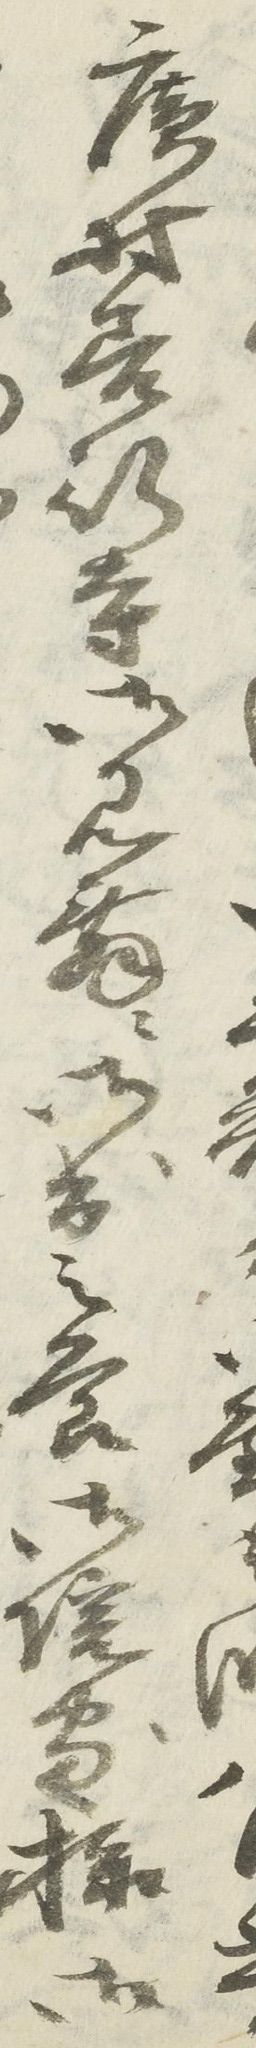広村善行寺御見舞ニ御出之節御院家様御
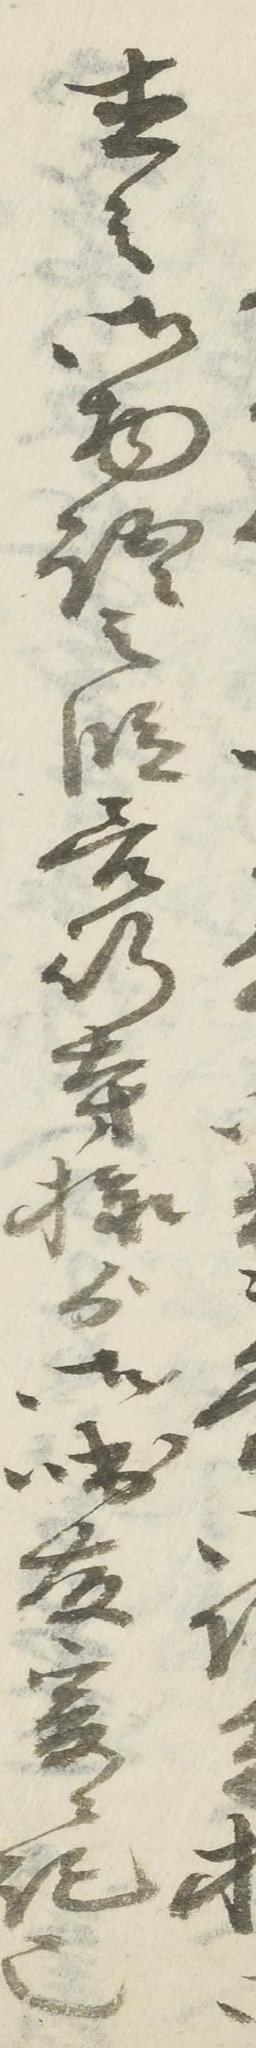直之御物語之段善行寺様ゟ御咄故爰ニ記也
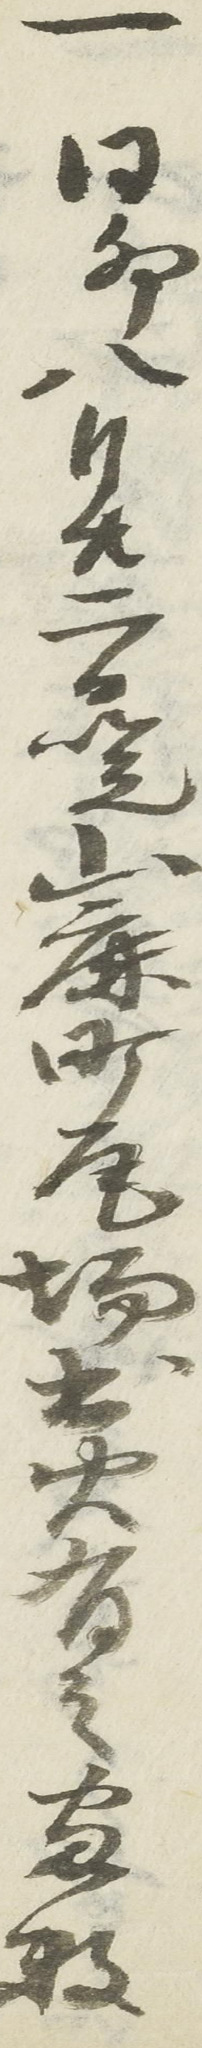一同卯八月廿二日晩山鹿町瓦場出火有之家数
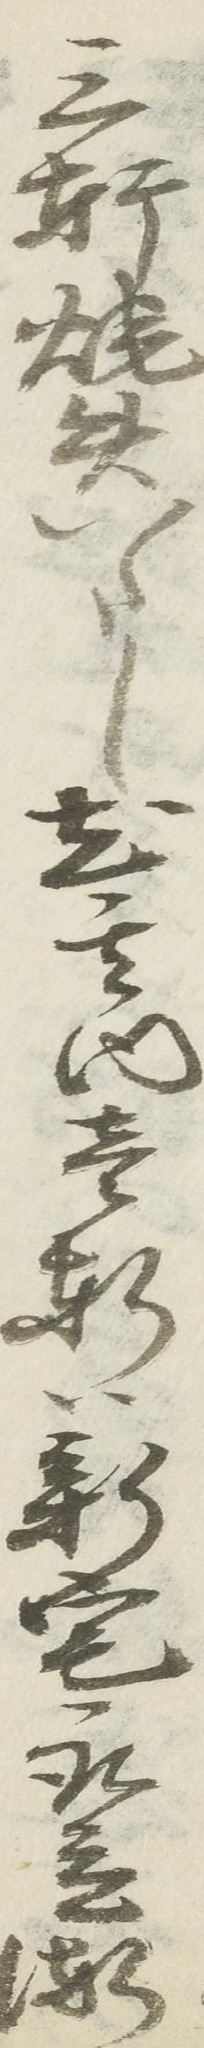三軒焼失いたし尤其内壱軒は新宅取立漸
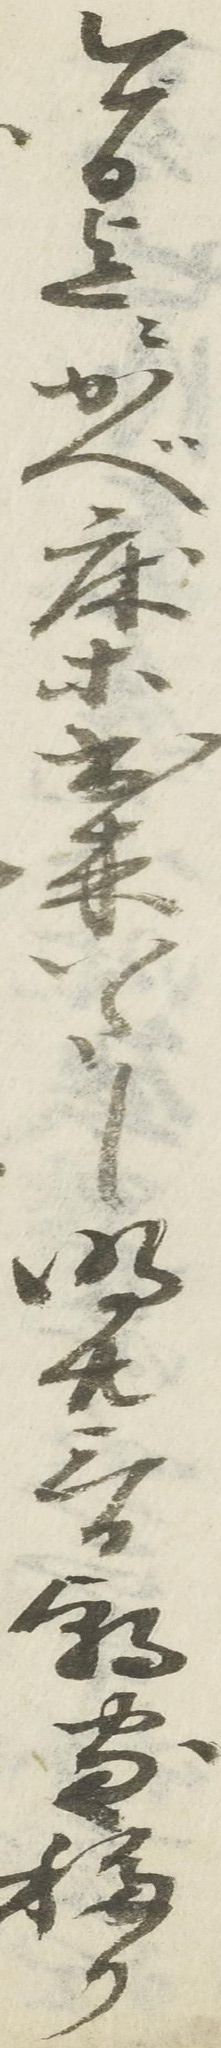今日迄ニかべ床等出来いたし明廿三日朝家移り
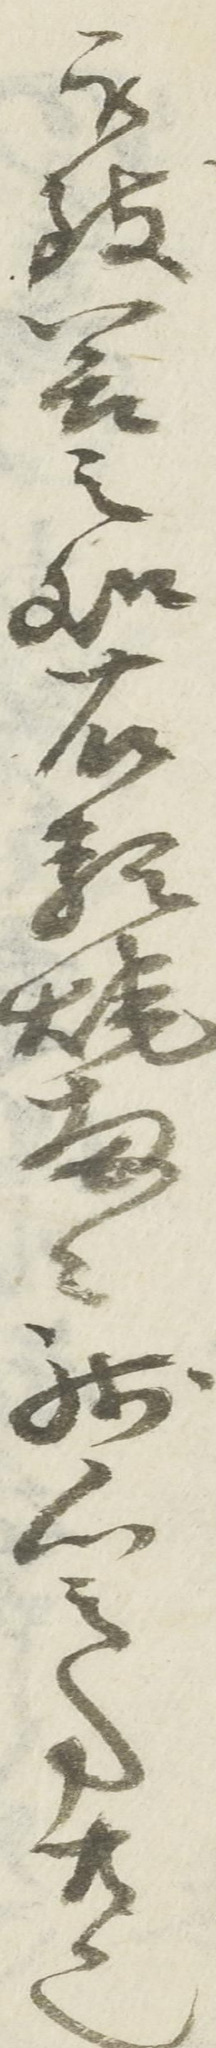被致筈之処右類焼扨々残心之事共也
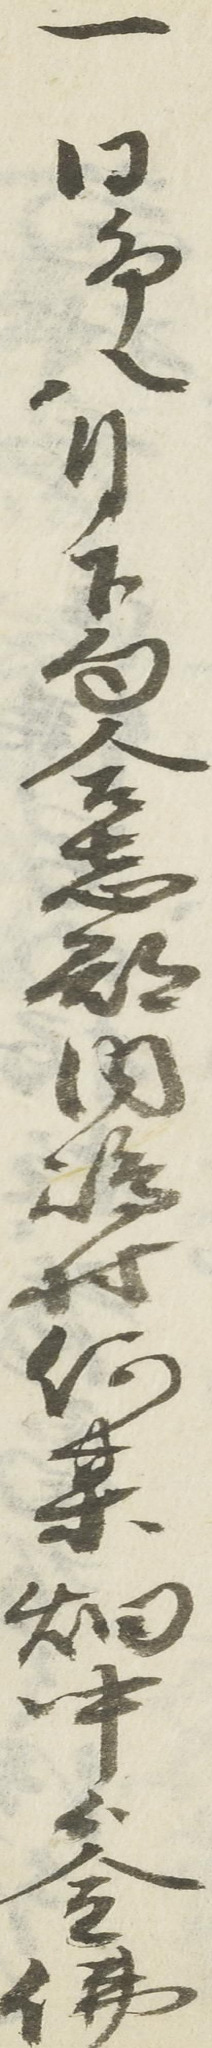一同卯八月下旬合志郡内嶋村何某畑中ゟ金仏
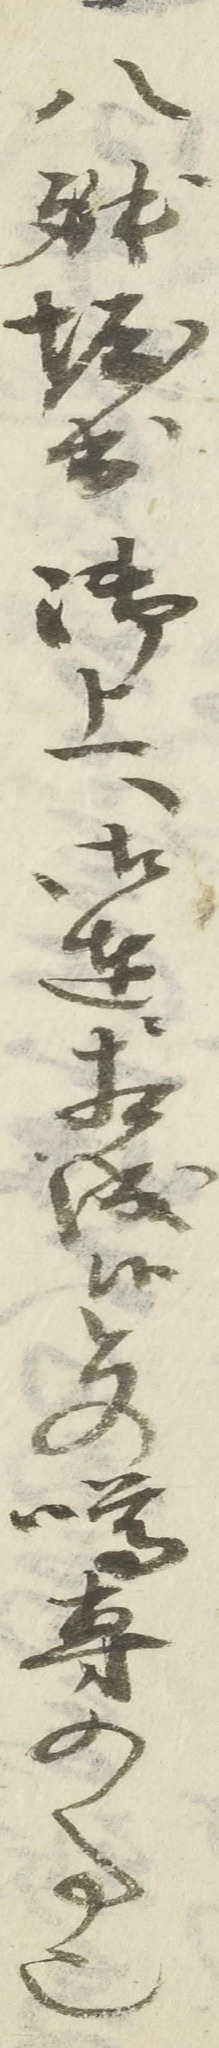八躰掘出御上へ御達ニ相成候との噂専の事也
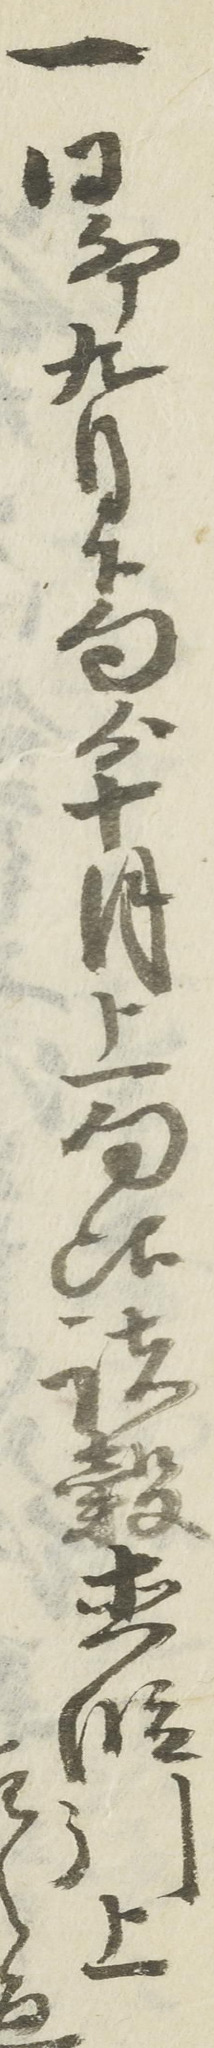一同卯九月下旬ゟ十月上旬比諸穀直段引上
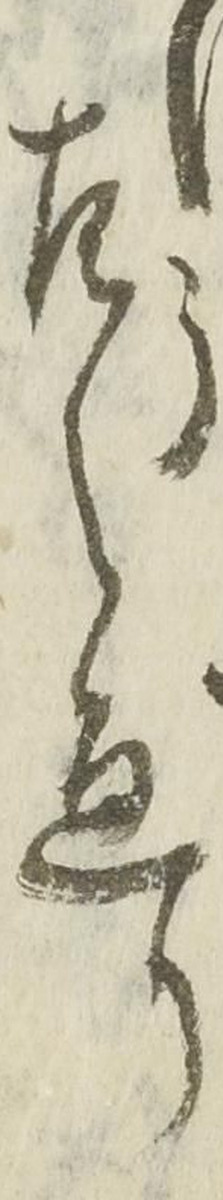左之通り
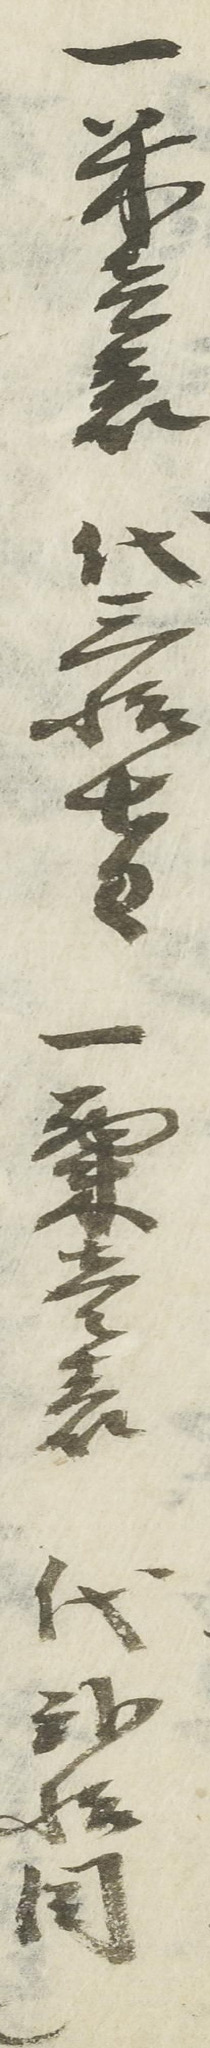一米壱表代三拾七匁一粟壱表代弐拾目
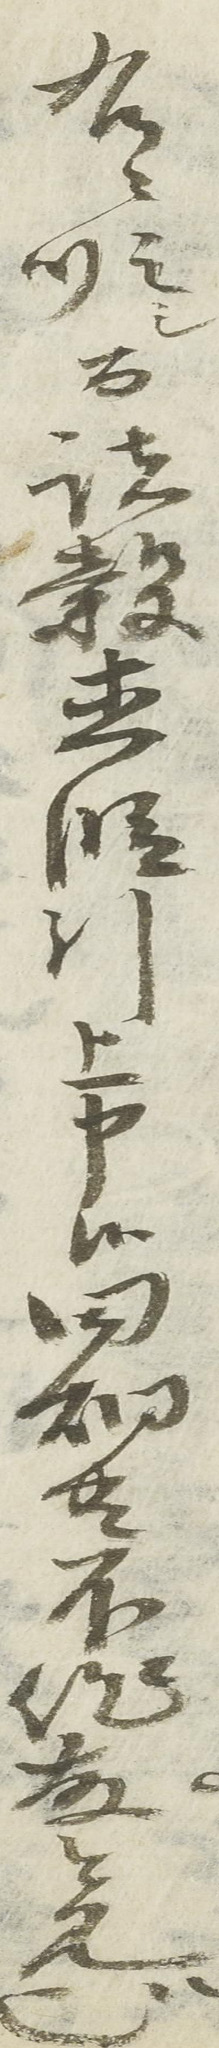右ニ順シ而諸穀直段引上申候田畑共不作故と見ル也
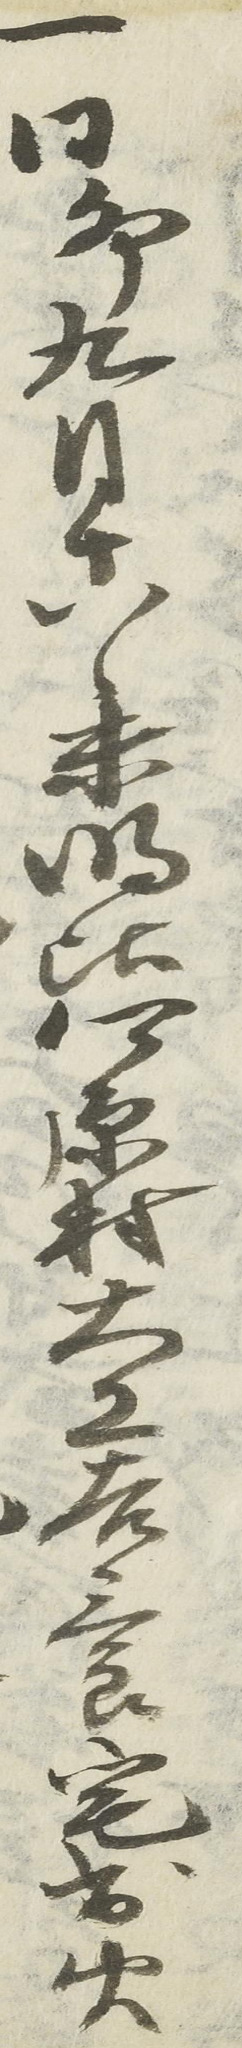一同卯九月十八未明比郷原村大工吉三郎宅出火
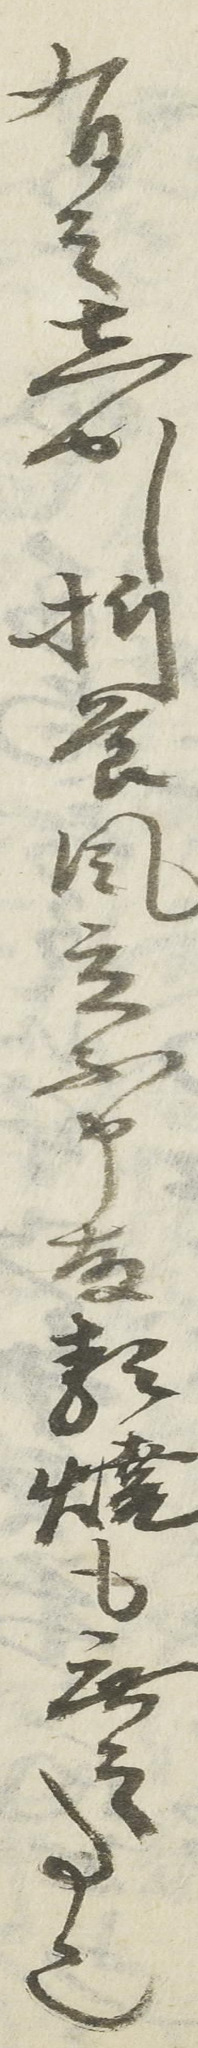有之しかし折節風立不申故類焼も無之事也
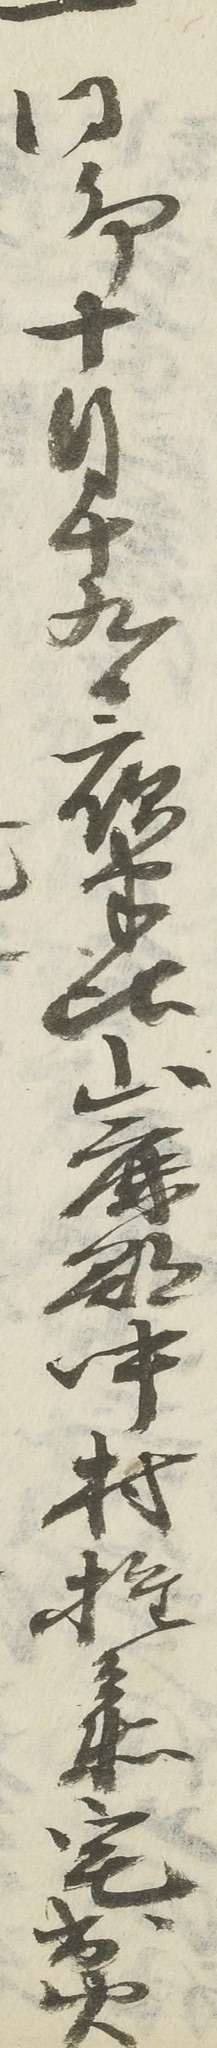一同卯十月十九日夜半比山鹿郡中村権兵衛宅出火
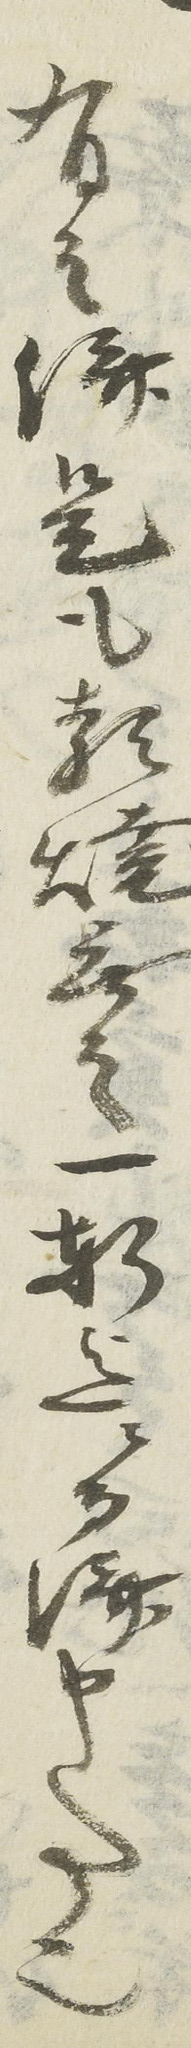有之併是も類焼無之一軒迄ニ而済申事也
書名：後見笑
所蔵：東京大学地震研究所図書室 Earthquake Research Institute Library, The University of Tokyo, JAPAN
